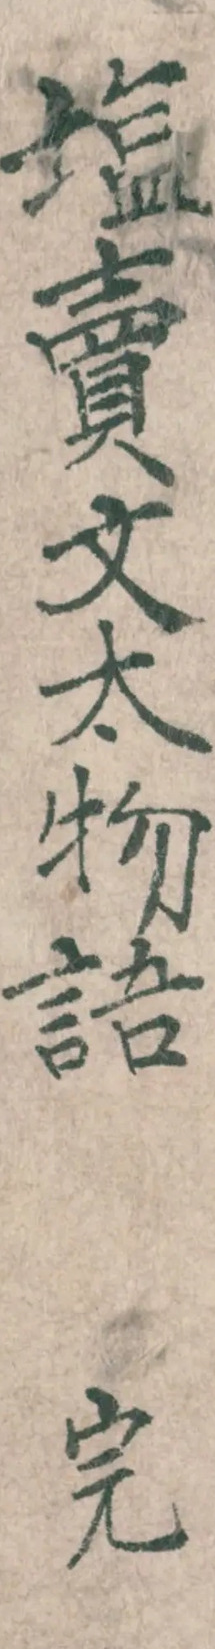塩売文太物語完

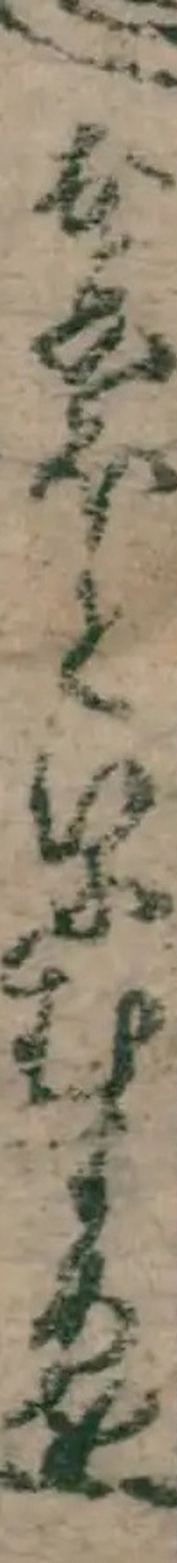おしほといふむすめを
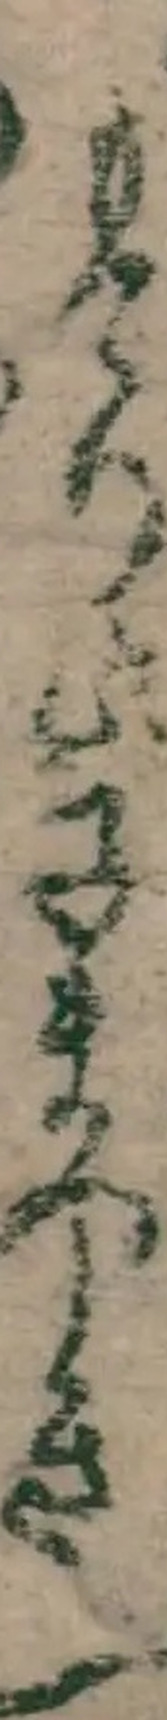もてり此子まつしき
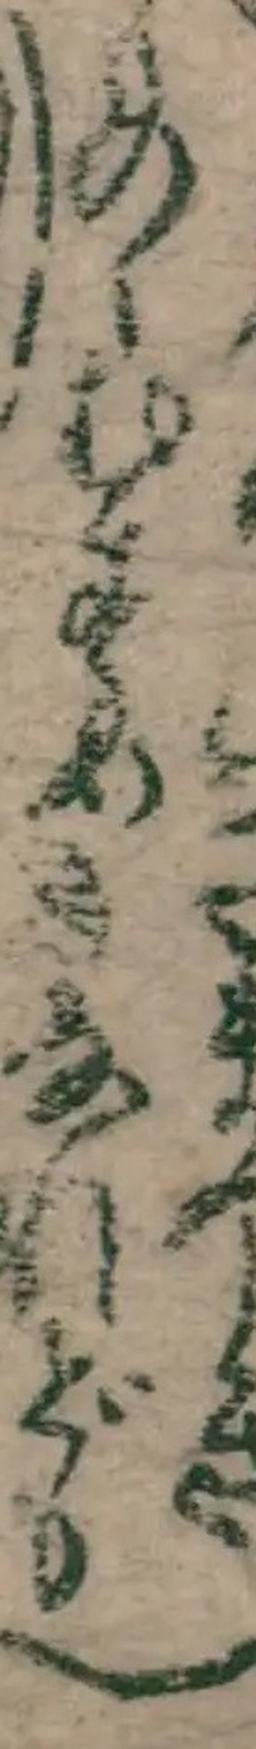ものゝむすめなれども
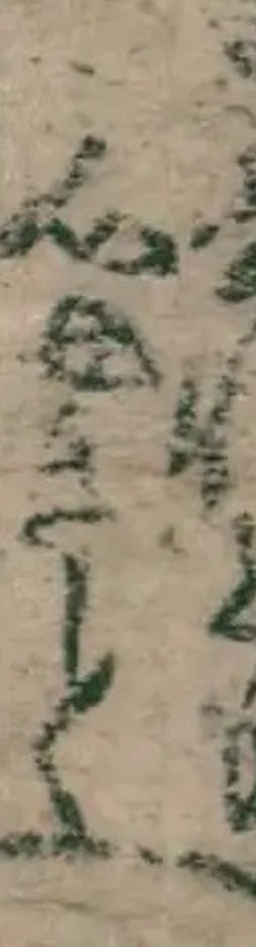心やさしく
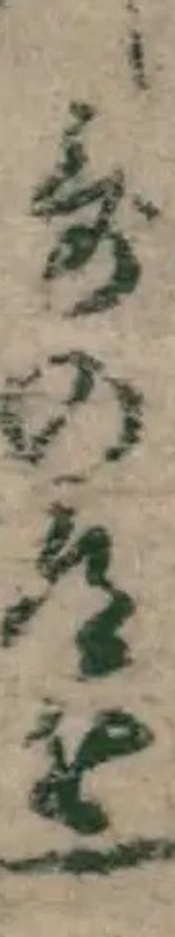哥の道を
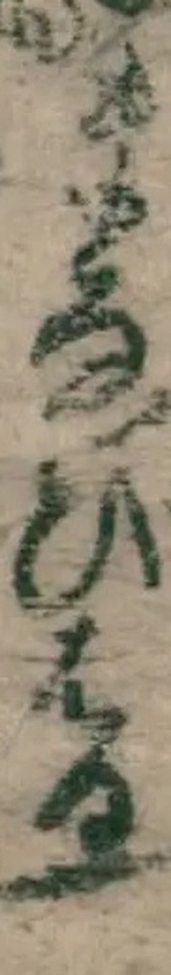まなびはる
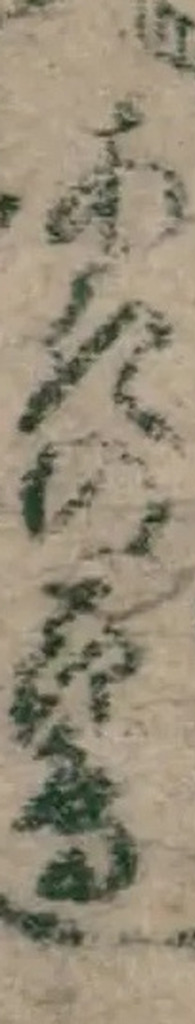あきの花鳥
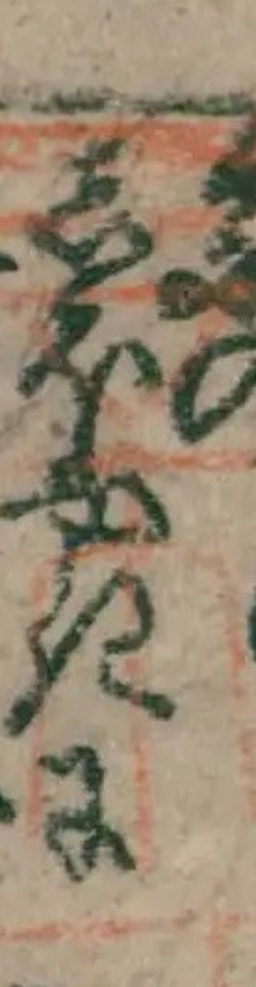しほやきに
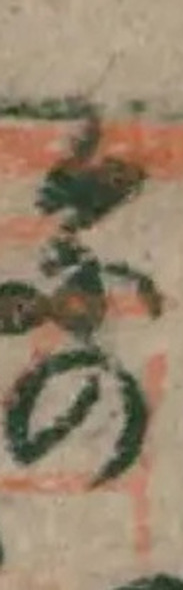くにの
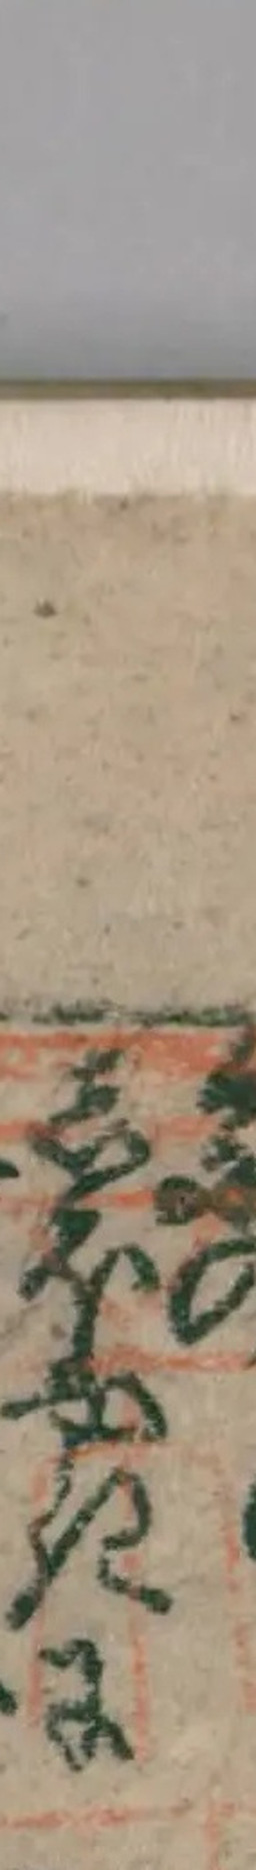しほやきに
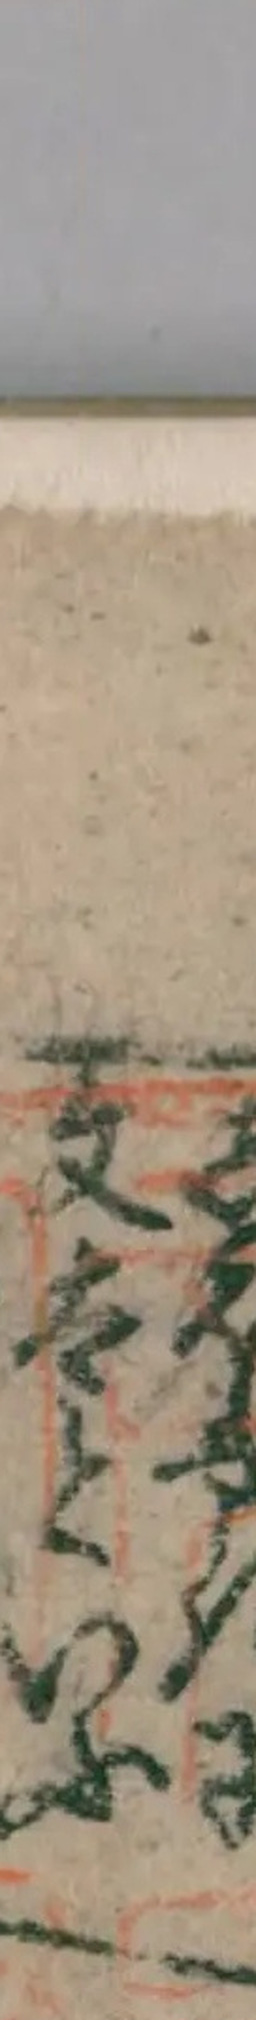文太といふ
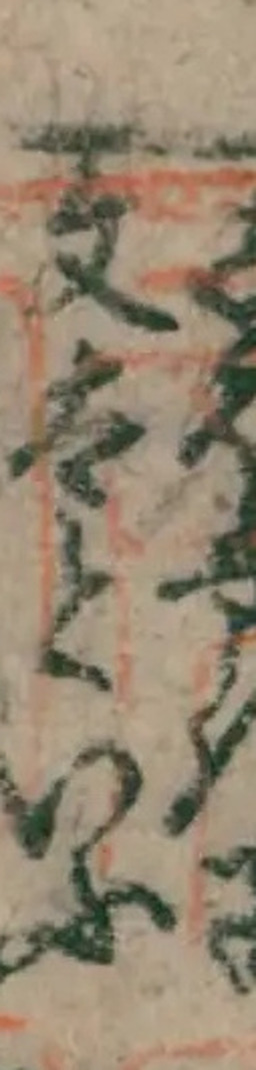文太といふ
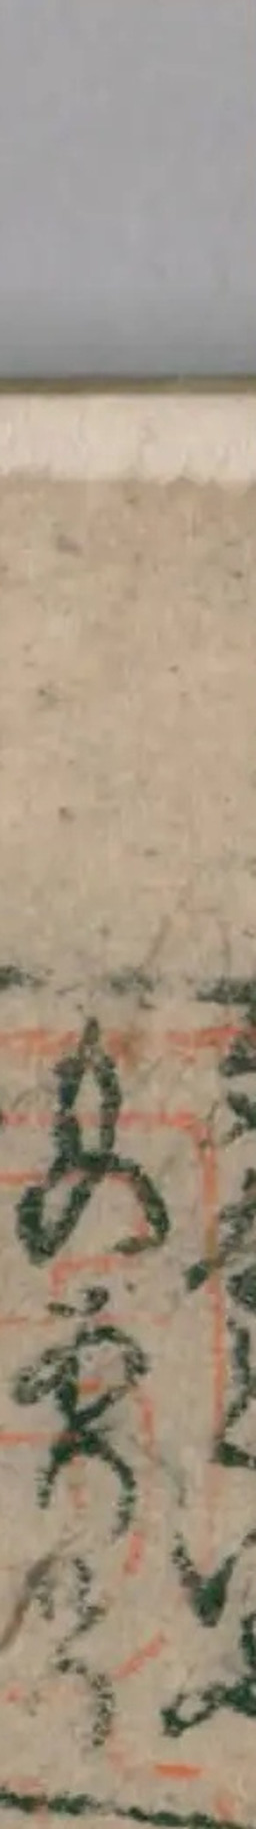ものありけり
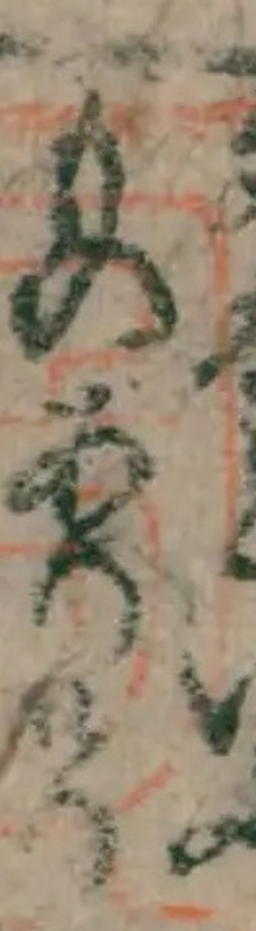ものありけり
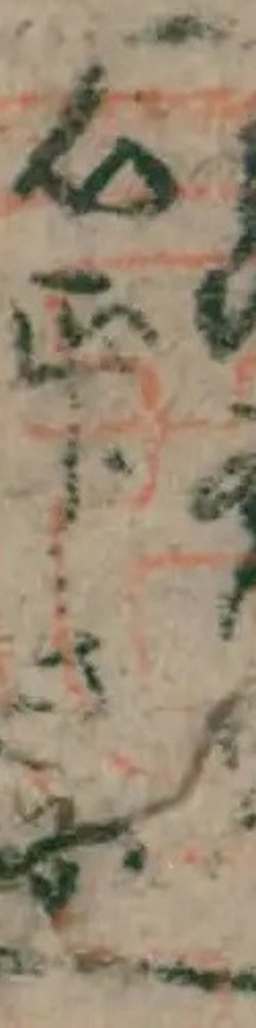心正じきに
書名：塩売文太物語 2巻
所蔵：国立国会図書館 National Diet Library, JAPAN
